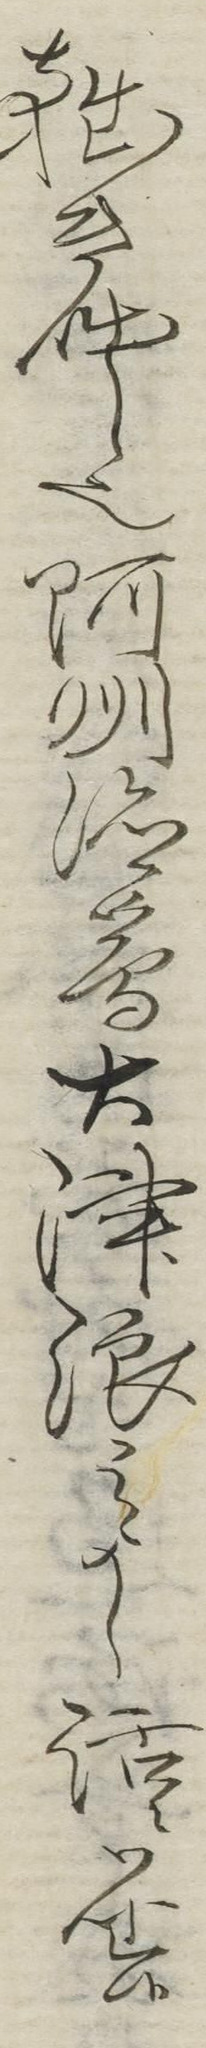難き咄し也阿州徳嶌大津浪之よし話ニ御座候

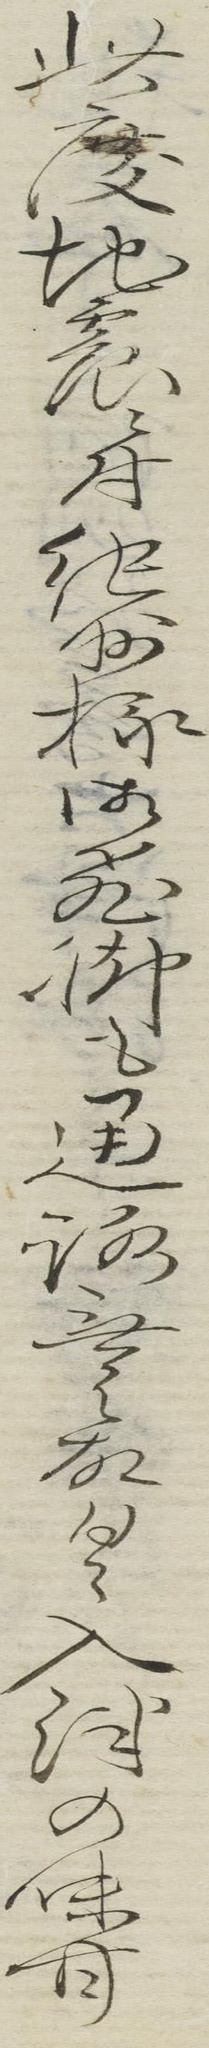此度地震ニ付紀州様御飛脚も通路無之故日〻入津の味甘
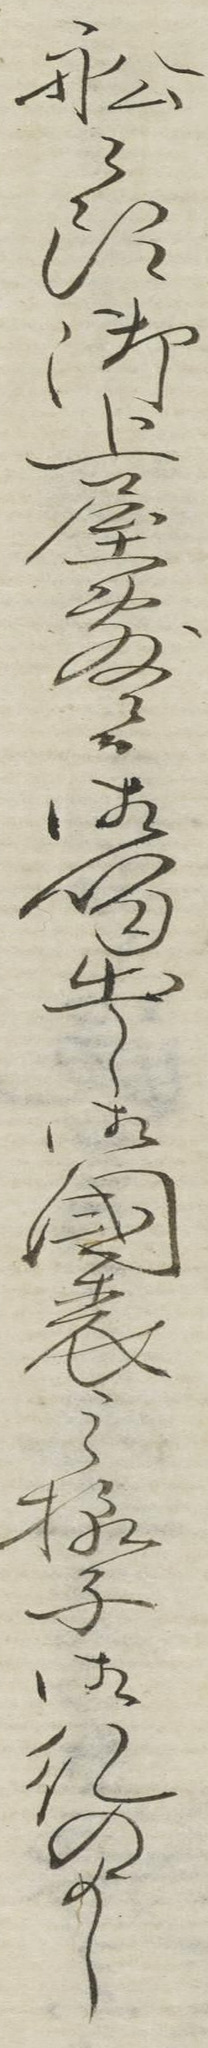船〻頭御上屋敷ニ而御呼出し御国表之様子御糺のよし
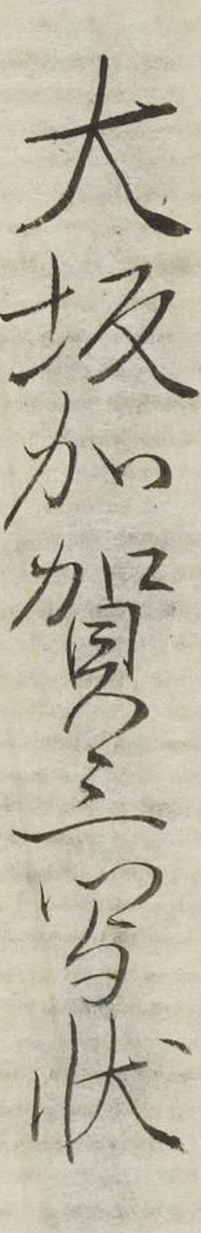大坂加賀三写状
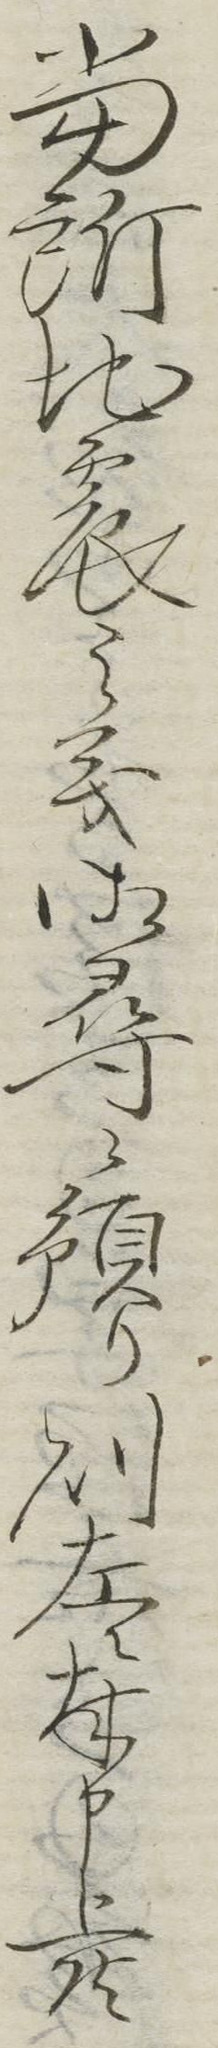当所地震之義御尋ニ預り則左ニ奉申上候
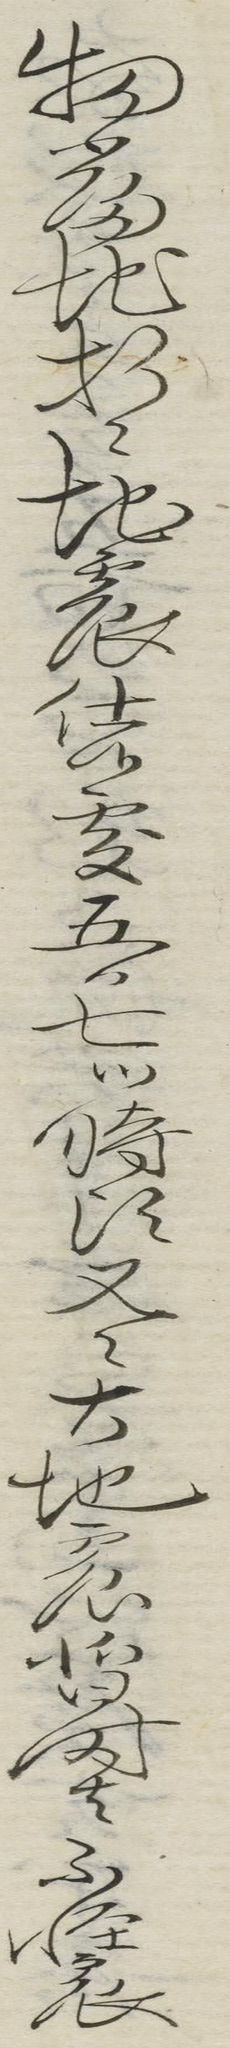物当地折〻地震仕候処五日七ツ時頃又〻大地震暫時は不怪震
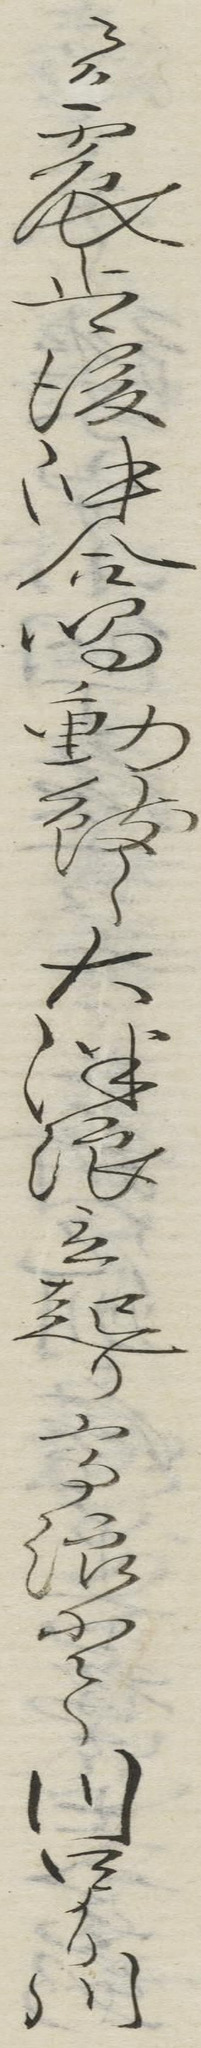ニ而震止候後沖合鳴動致し大津浪立起り高浪にて川口より川
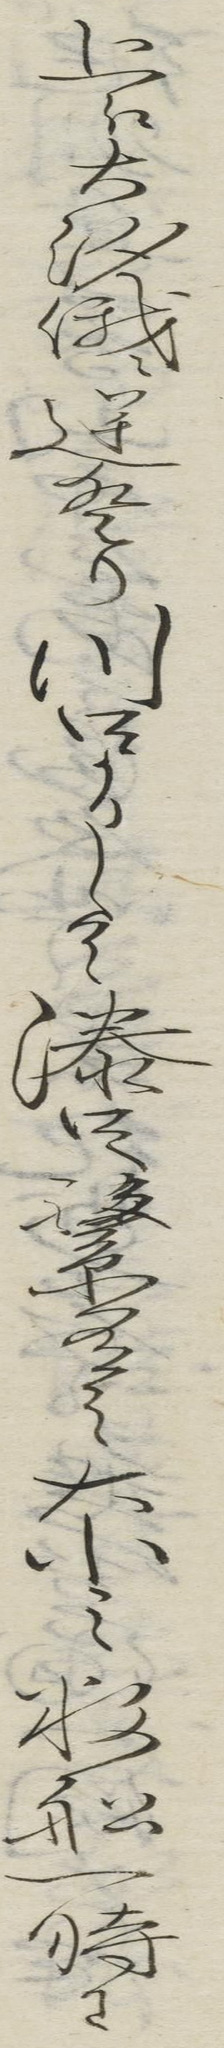上江大汐俄ニ逆登り川口よりして湊口へ繋有之大小之数船一時に
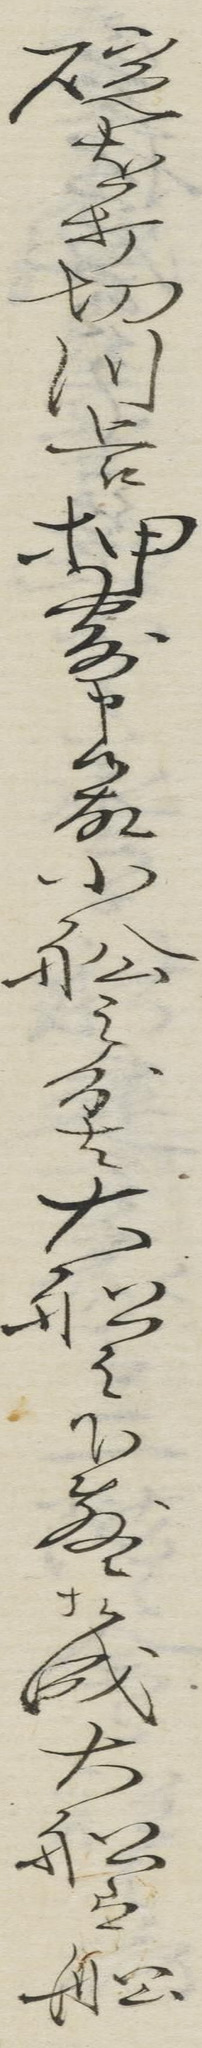碇を打切川上江押寄申候故小船之分は大船之下敷ニ相成大船は船
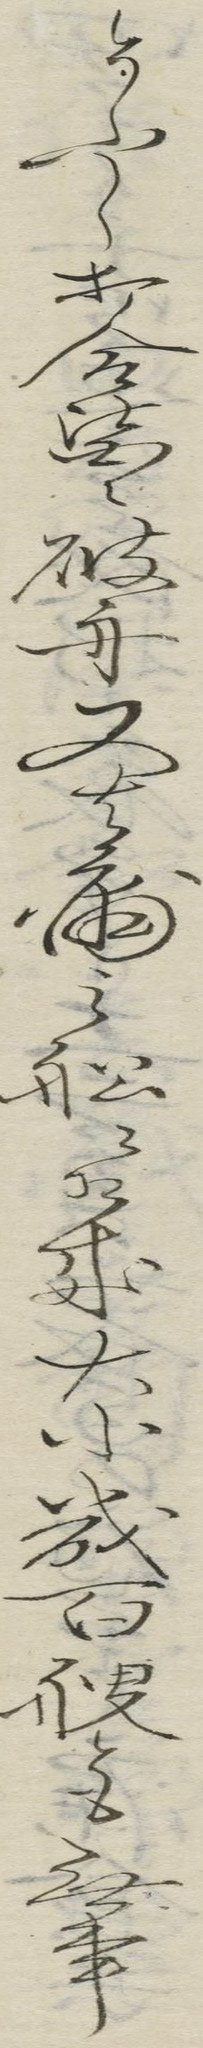とふし打合皆〻破舟又は痛ミ船ニ相成大小幾百艘とも無事
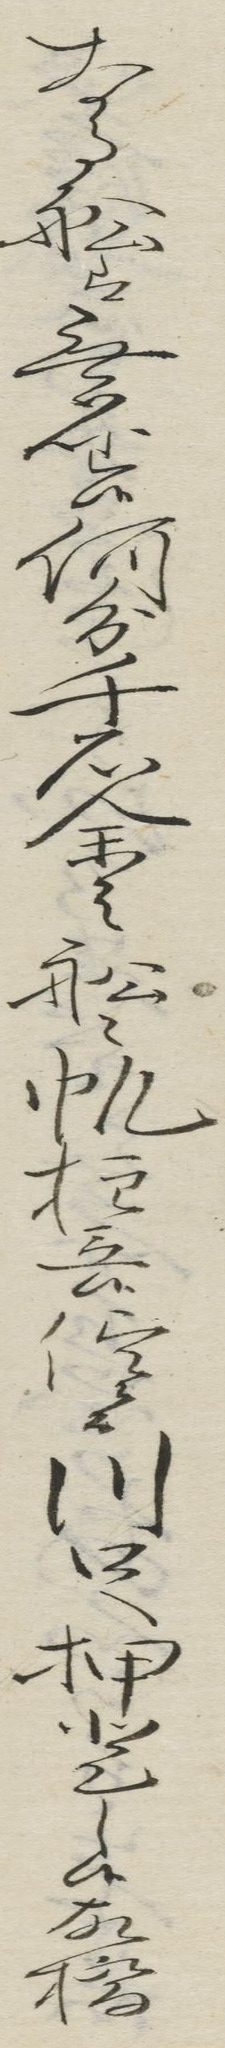なる船は無御座候何分千石余之船〻帆柱立候侭ニ而川口へ押登し候故橋
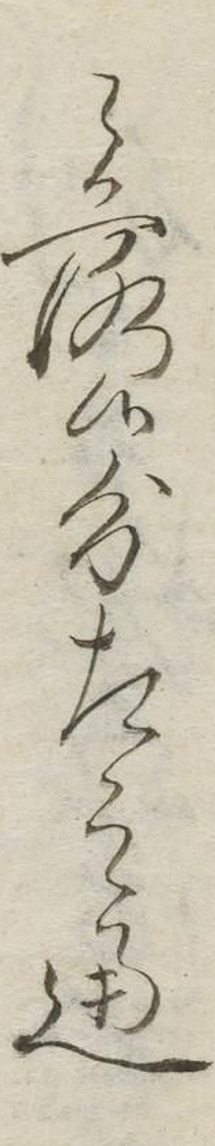〻落候分左之通
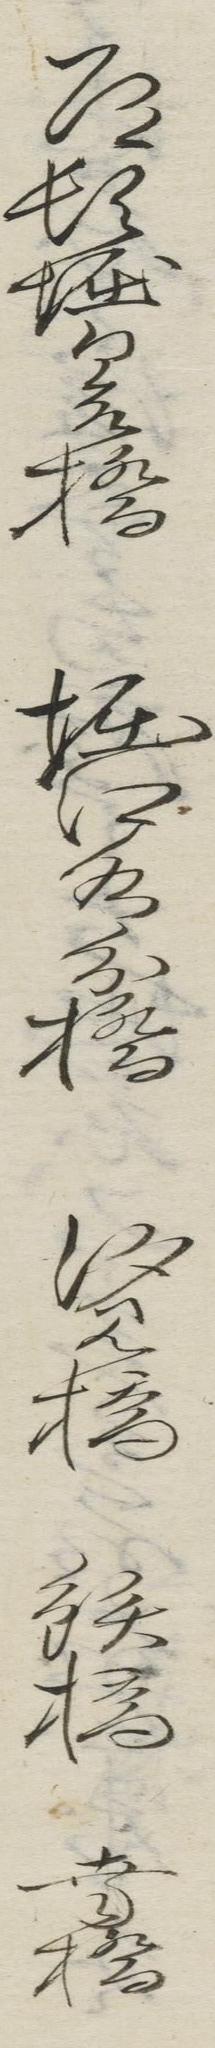道頓堀日吉橋堀江水分橋汐見橋鉄橋幸橋
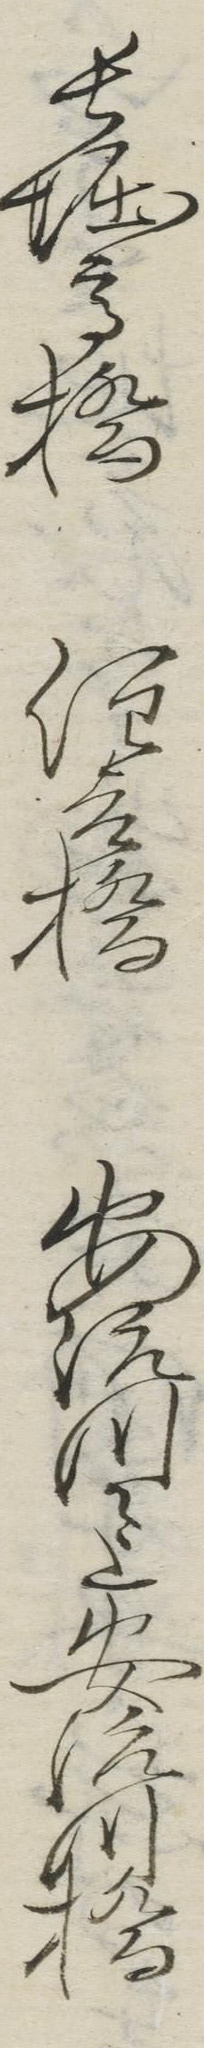長堀高橋住吉橋安治川之上安治川橋
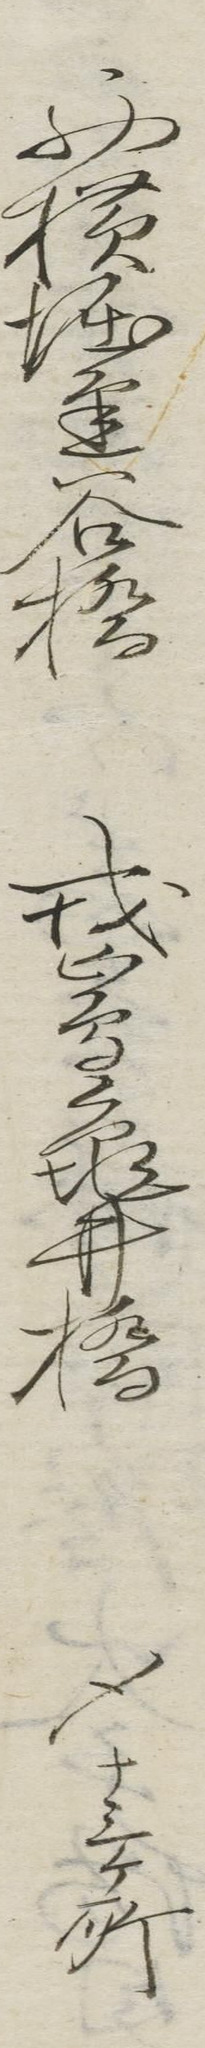西横堀金谷橋戎嶌亀井橋〆十三ケ所
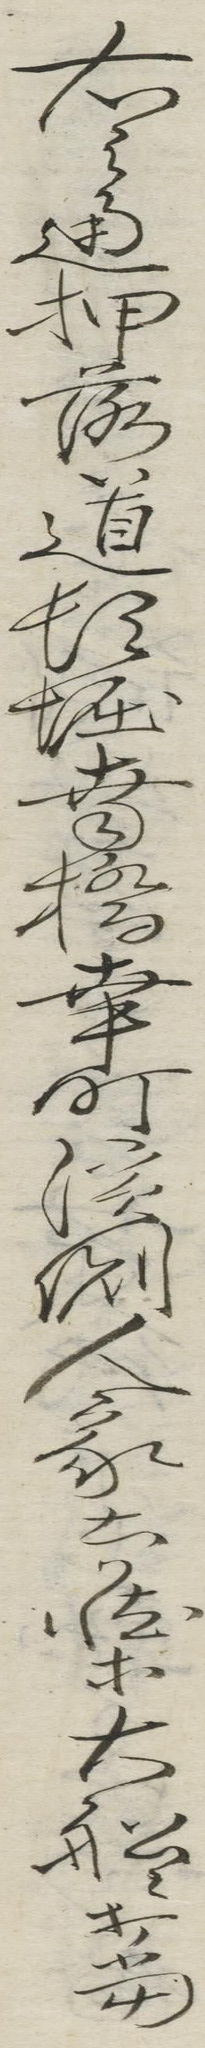右之通押落道頓堀幸橋幸町濱側人家土蔵等大船ニ打当
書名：大地震實録
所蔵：東京大学地震研究所図書室 Earthquake Research Institute Library, The University of Tokyo, JAPAN
